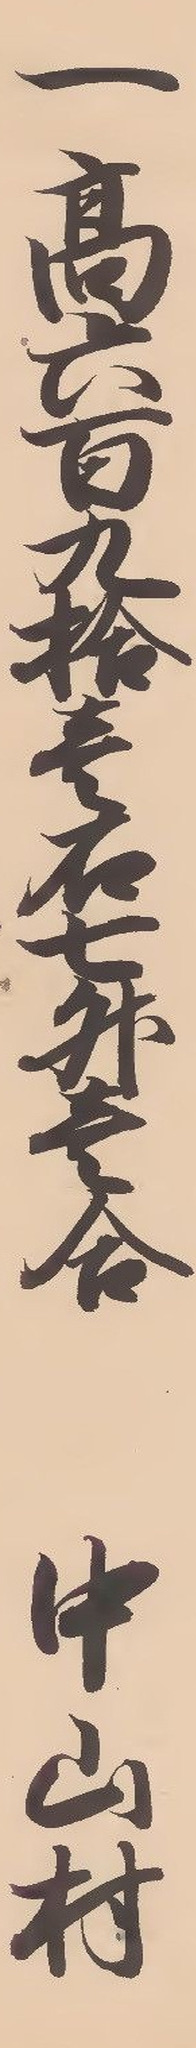一高六百九拾壱石七升壱合中山村

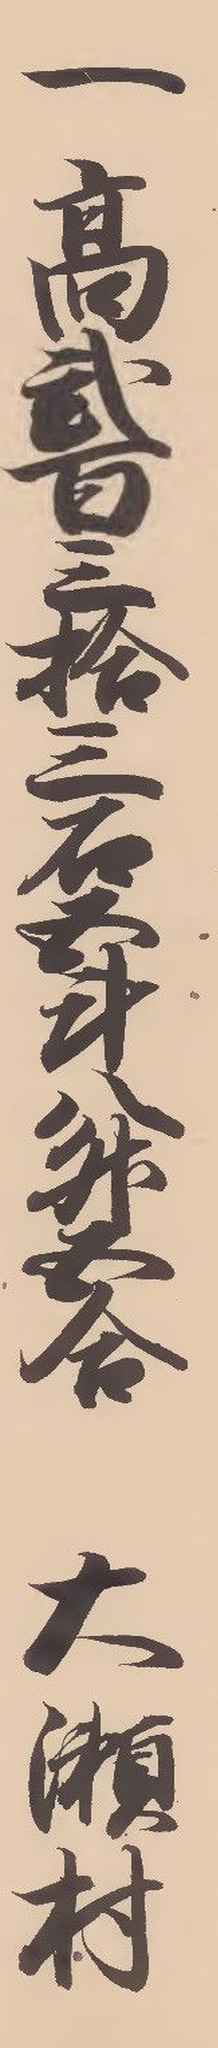一高弐百三拾三石五斗八升五合大瀬村
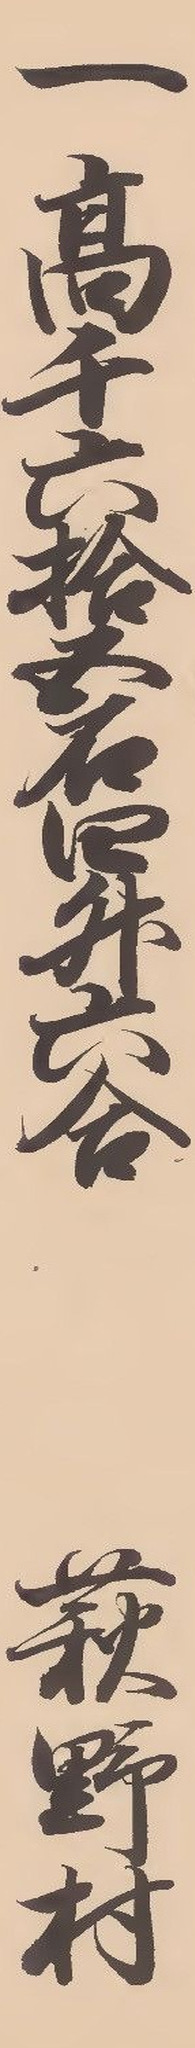一高千六拾五石四升六合萩野村
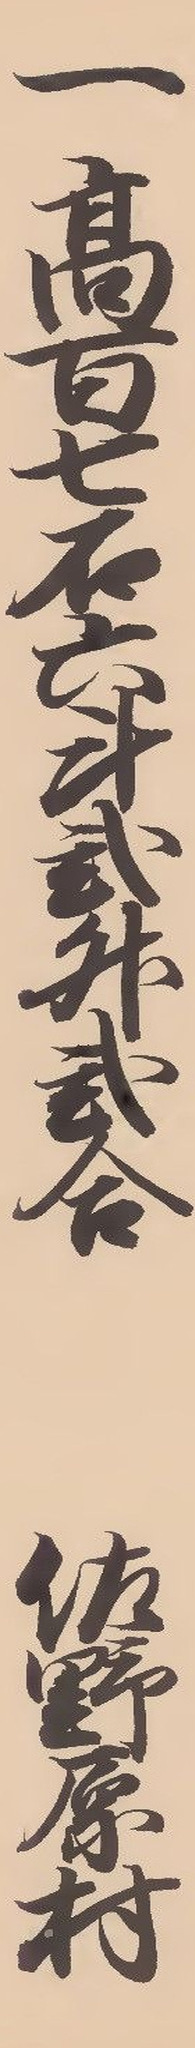一高百七石六斗弐升弐合佐野原村
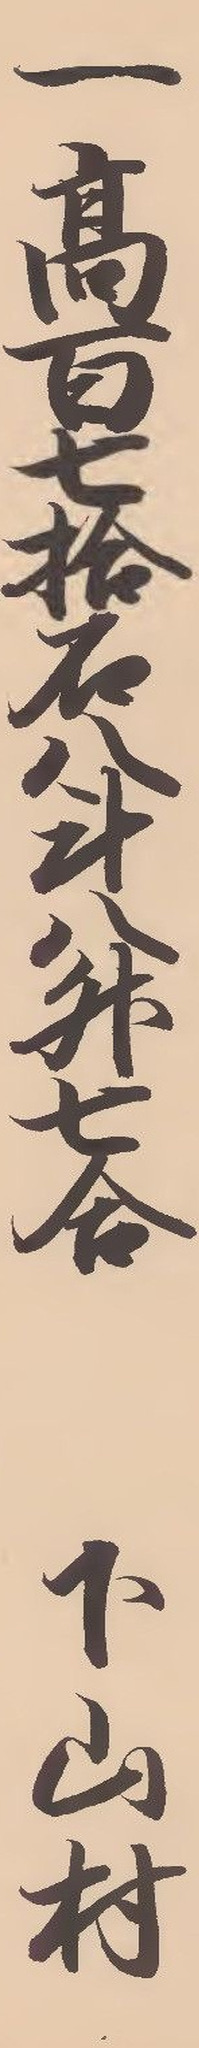一高百七拾石八斗八升七合下山村
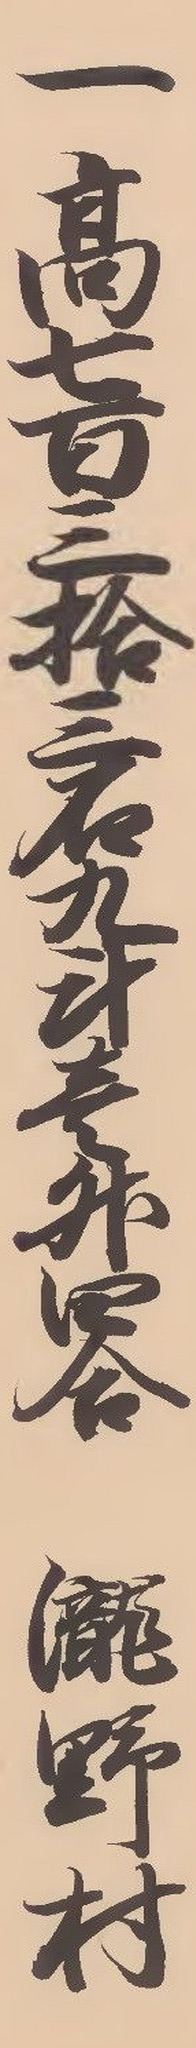一高七百三拾三石九斗壱升四合滝野村
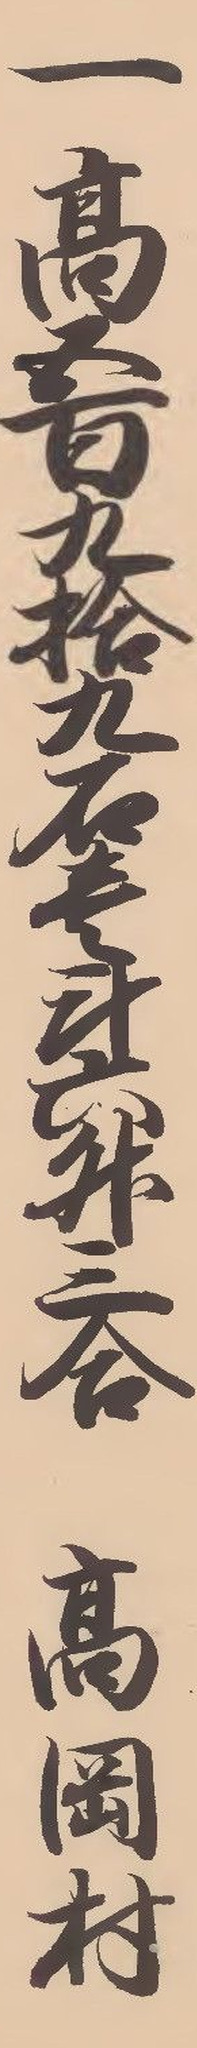一高五百九拾九石壱斗六升三合高岡村
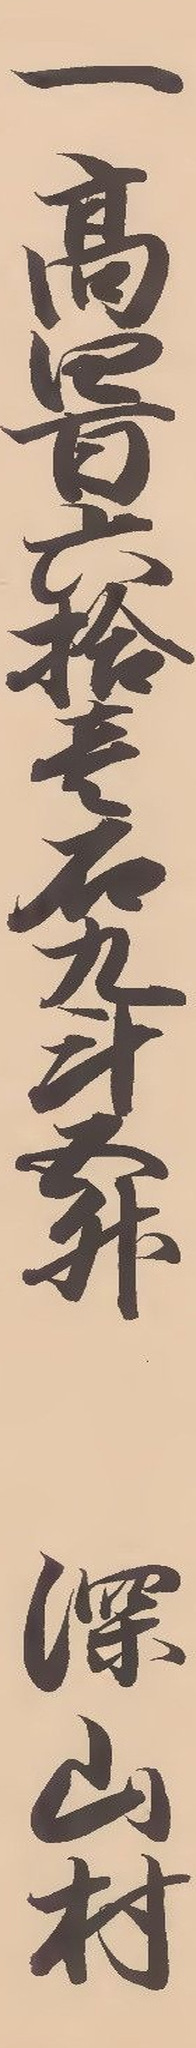一高四百六拾壱石九斗五升深山村
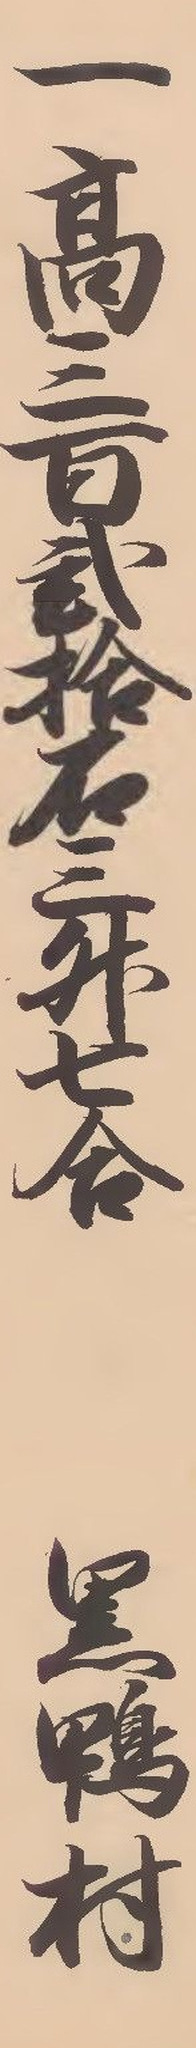一高三百弐拾石三升七合黒鴨村

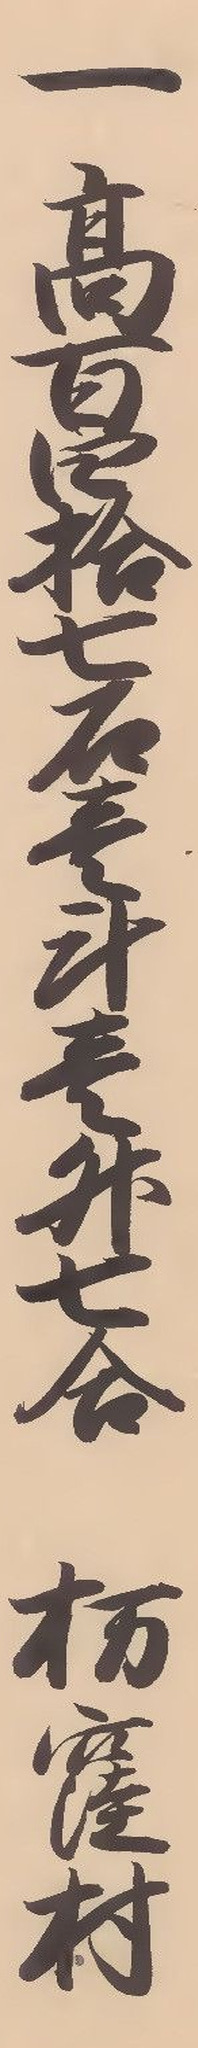一高百四拾七石壱斗壱升七合栃窪村
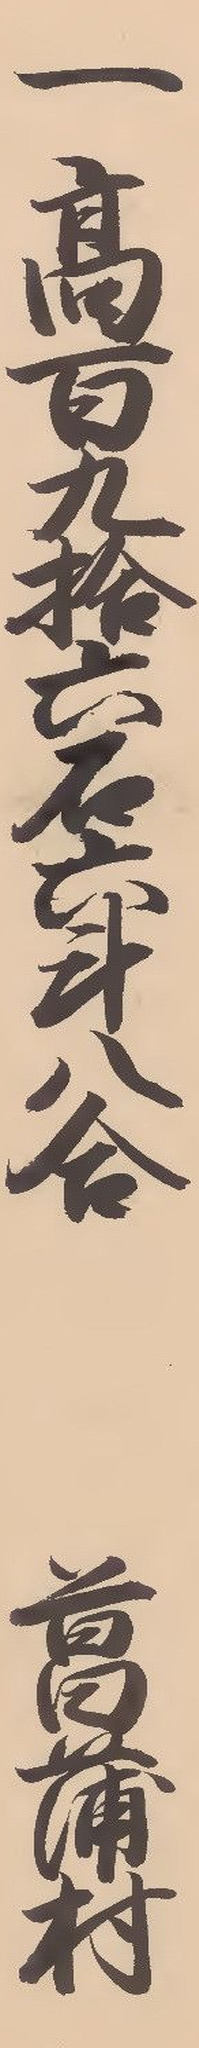一高百九拾六石六斗八合菖蒲村
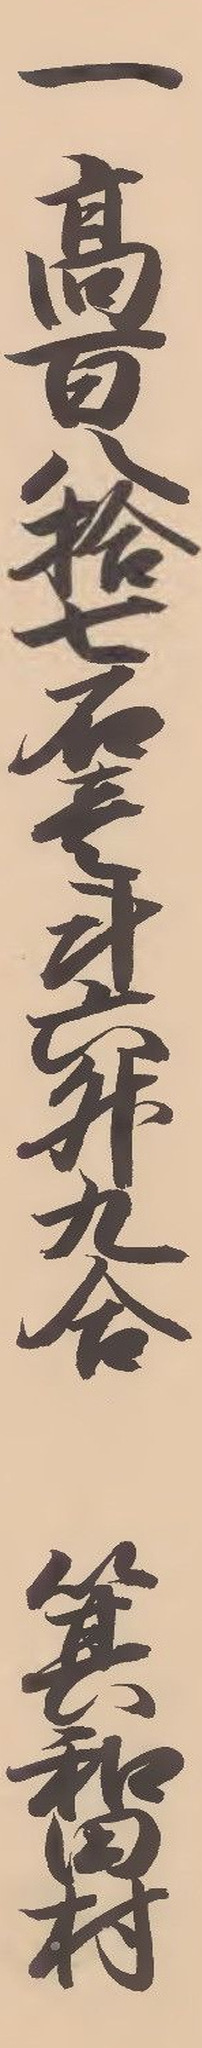一高百八拾七石壱斗六升九合箕和田村
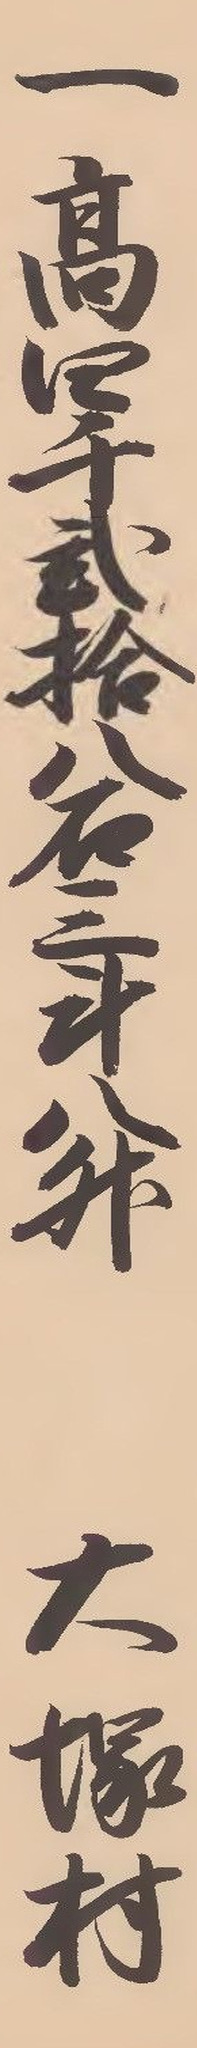一高四千弐拾八石三斗八升大塚村
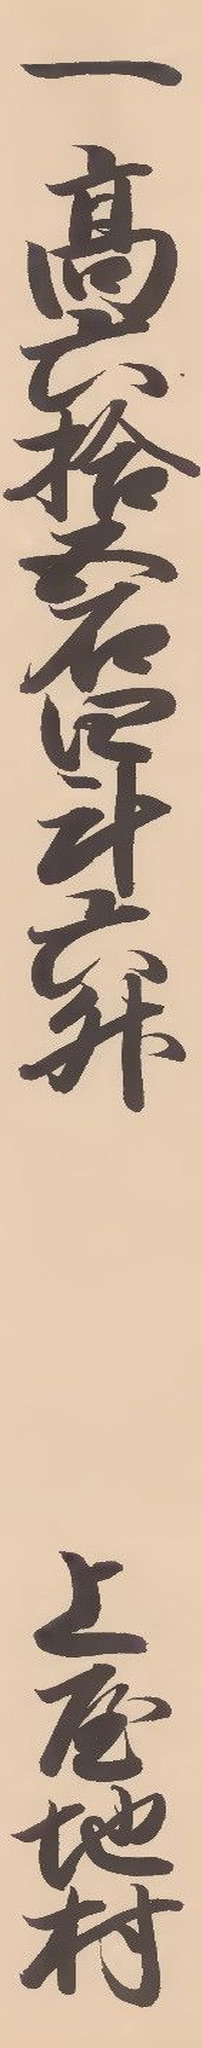一高六拾五石四斗六升上屋地村
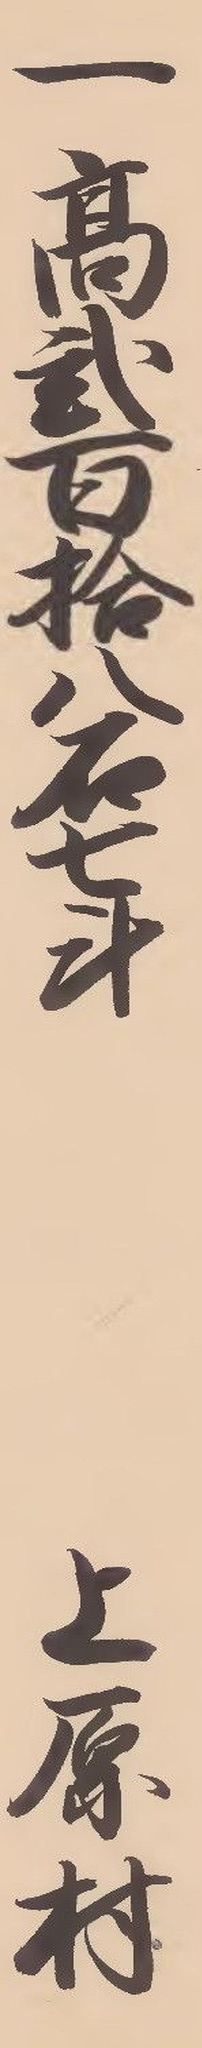一高弐百拾八石七斗上原村
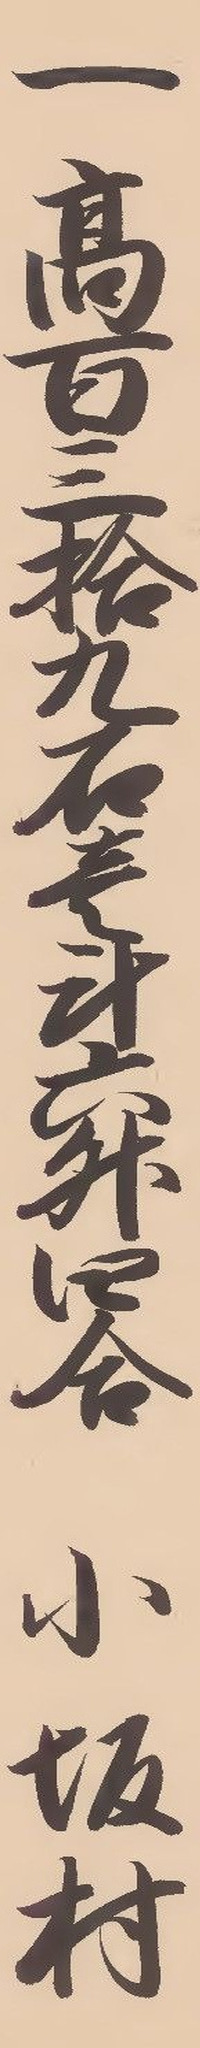一高百三拾九石壱斗六升四合小坂村
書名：出羽国郷帳　１
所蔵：国立公文書館 National Archives of Japan
